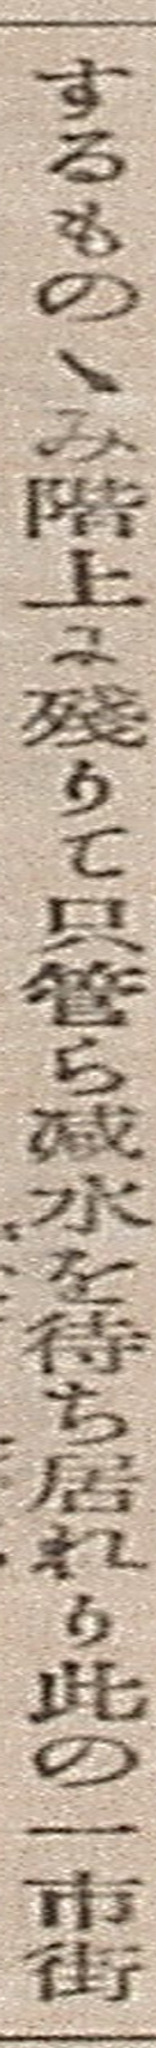するものゝみ階上に残りて只管ら減水を待ち居れり此の一市街
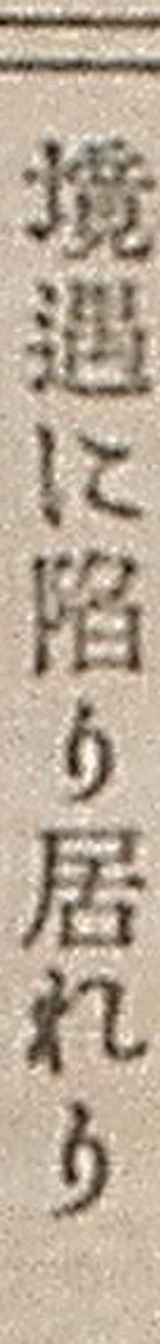境遇に陥り居れり
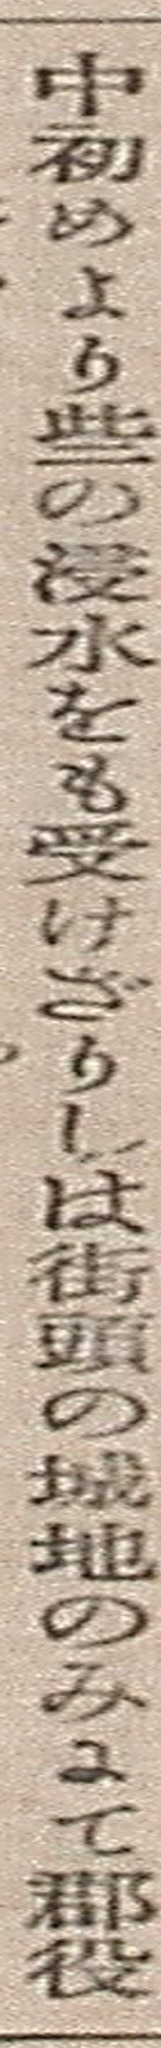中初めより些の浸水をも受けざりしは街頭の城地のみにて郡役
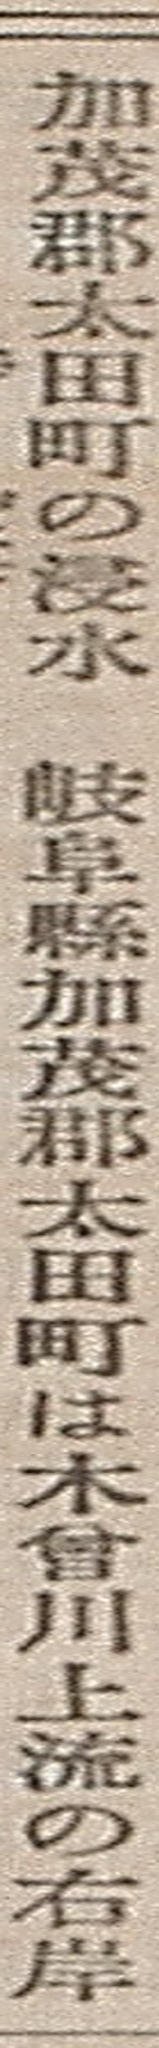加茂郡太田町の浸水岐阜県加茂郡太田町は木曽川上流の右岸
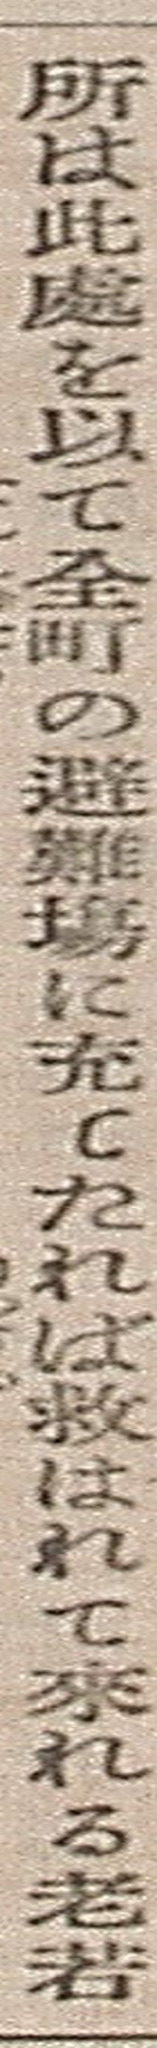所は此処を以て全町の避難場に宛てたれば救はれて来れる老若
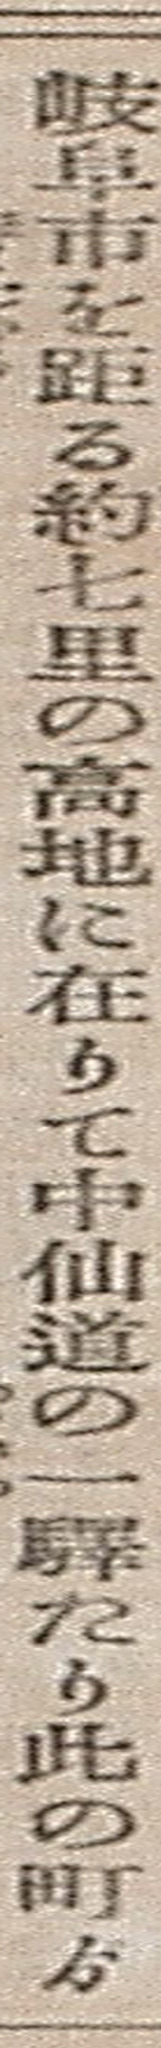岐阜市を距る約七里の高地に在りて中仙道の一駅たり此の町ゟ
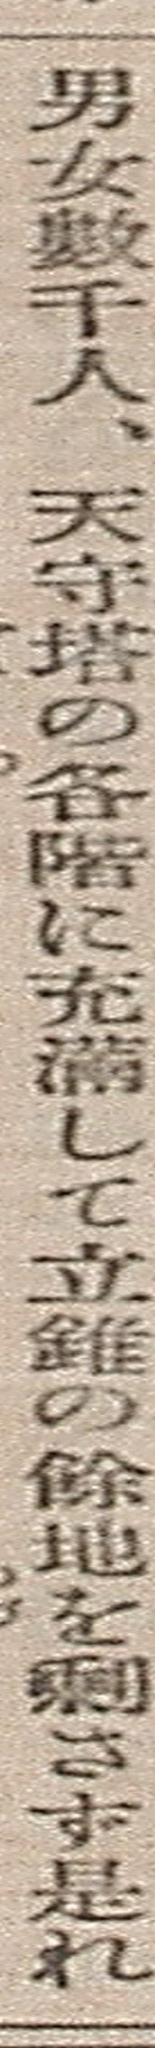男女数千人、天守塔の各階に充満して立錐の餘地を剰さず是れ
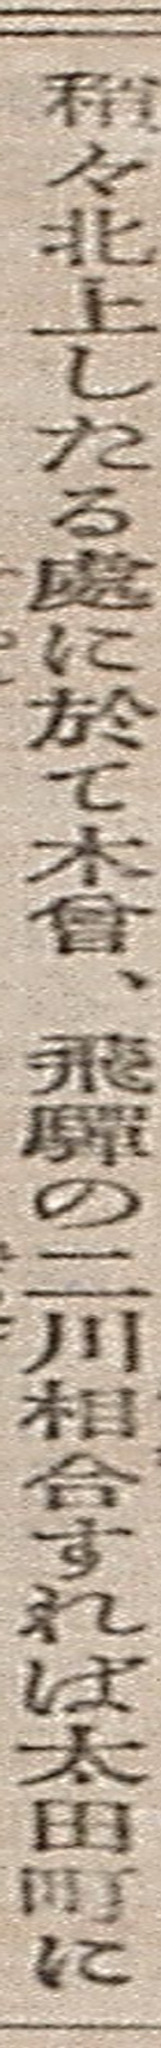稍々北上したる処に於て木曽、飛騨の二川相合すれば太田町に
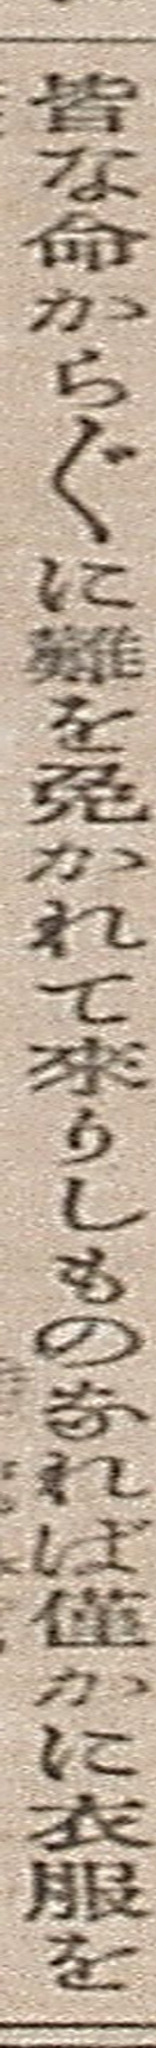皆な命から〴〵に難を免かれて来りしものなれば僅かに衣服を
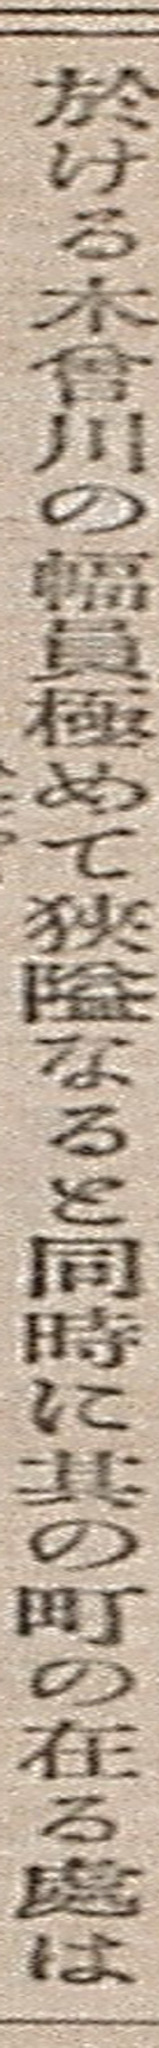於ける木曽川の幅員極めて狭隘なると同時に其の町の在る処は
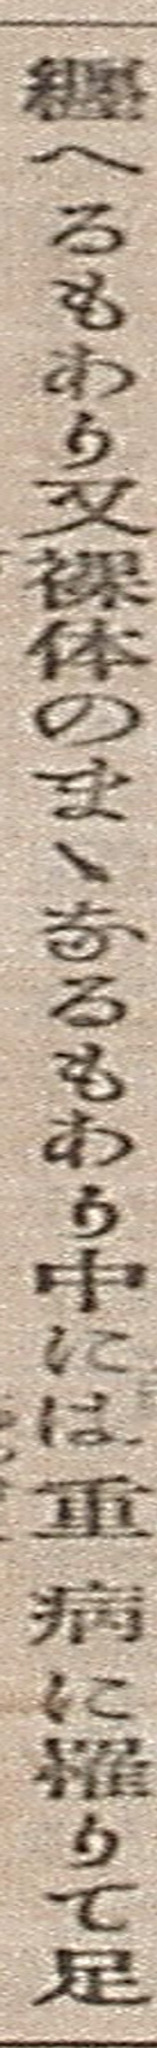纏へるもあり又裸体のまゝなるもあり中には重病に罹りて足
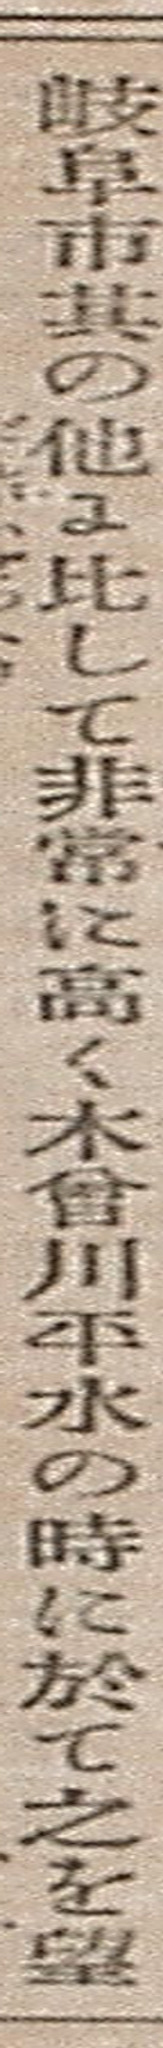岐阜市其の他に比して非常に高く木曽川平水の時に於て之を望
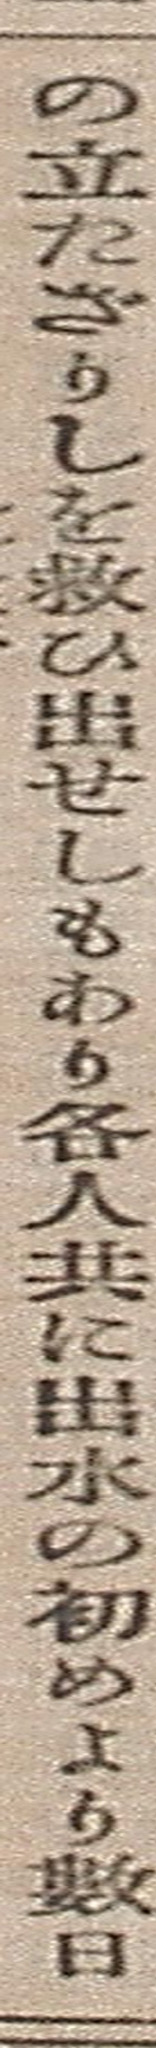の立たざりしを救ひ出せしもあり各人共に出水の初めより数日
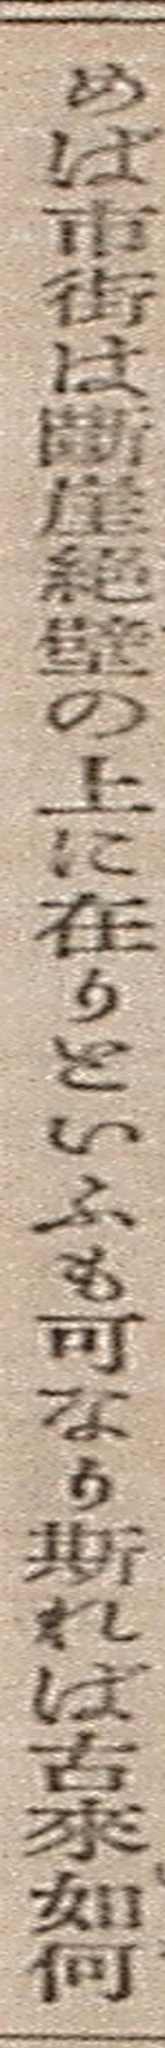めば市街は断崖絶壁の上に在りといふも可なり斯れば古来如何
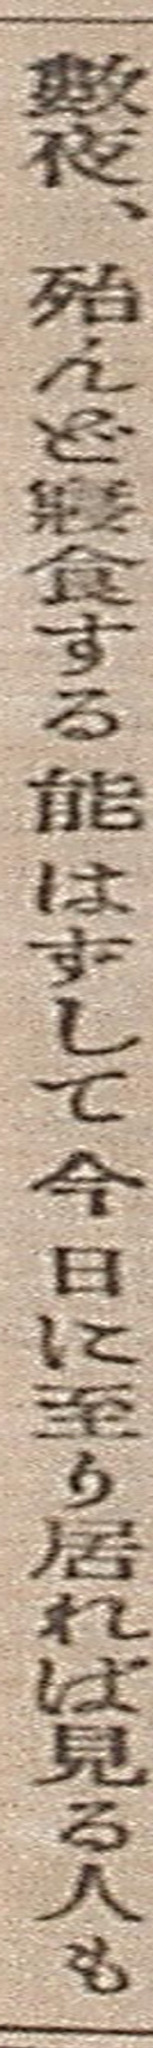数夜、殆んど寝食する能はずして今日に至り居れば見る人も

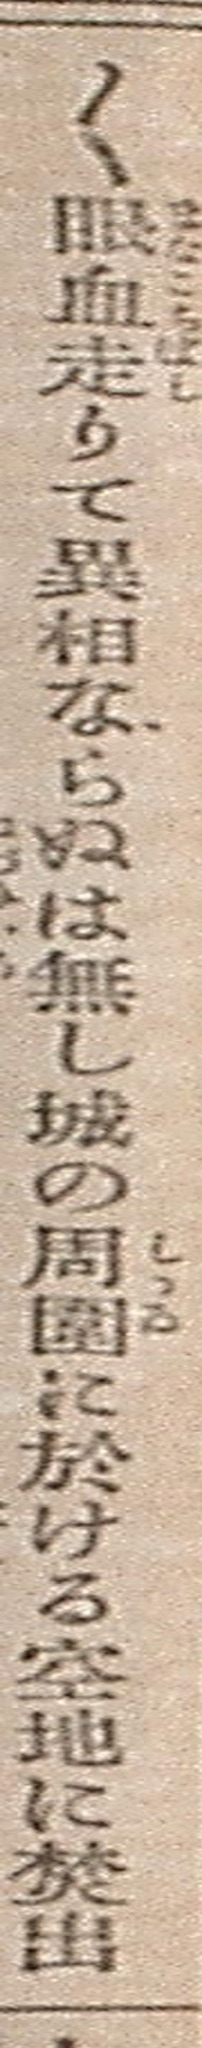〳〵眼血走りて異相ならぬは無し城の周囲に於ける空地に焚出
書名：風俗畫報臨時増刊第百二十六號　洪水被害録（中）
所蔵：東京大学地震研究所図書室 Earthquake Research Institute Library, The University of Tokyo, JAPAN
